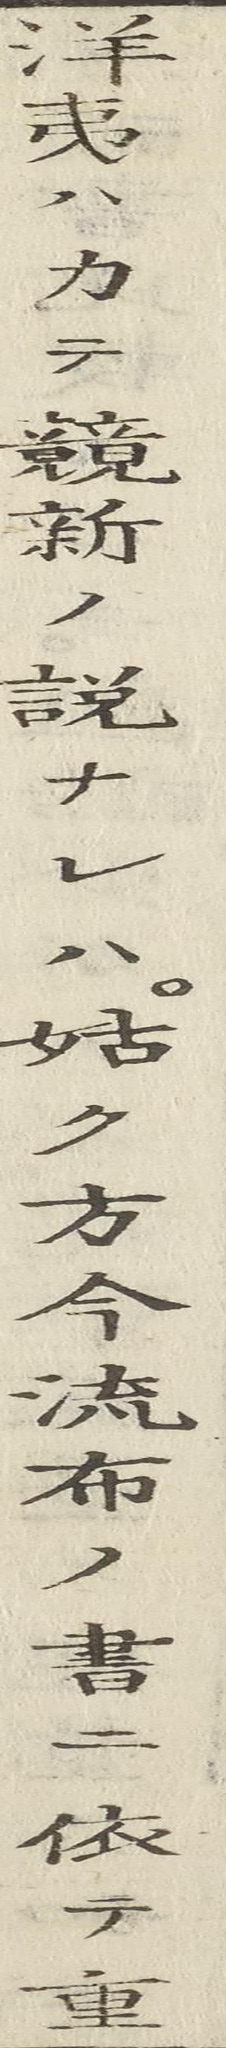洋夷ハカテ竸新ノ説ナレハ。姑ク方今流布ノ書ニ依テ重

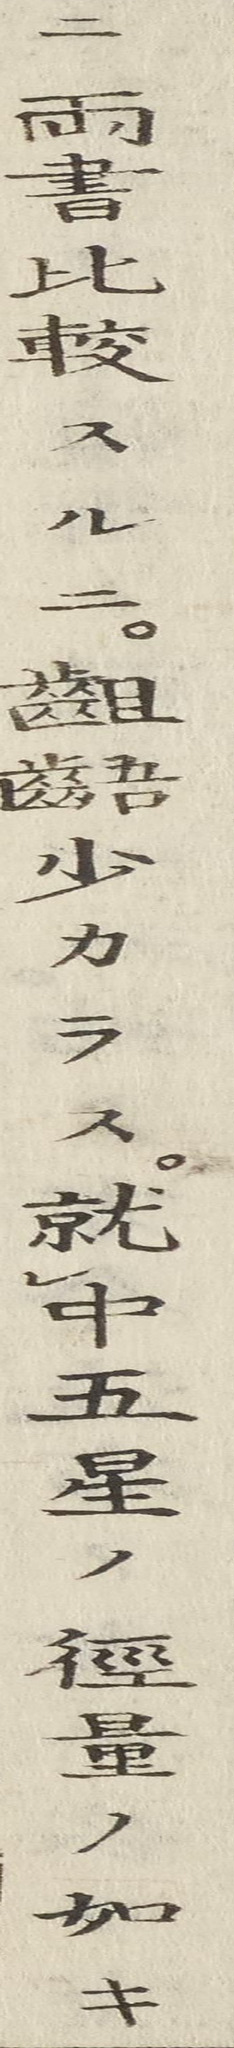ニ両書比較スルニ。齟齬少カラス。就中五星ノ径量ノ如キ
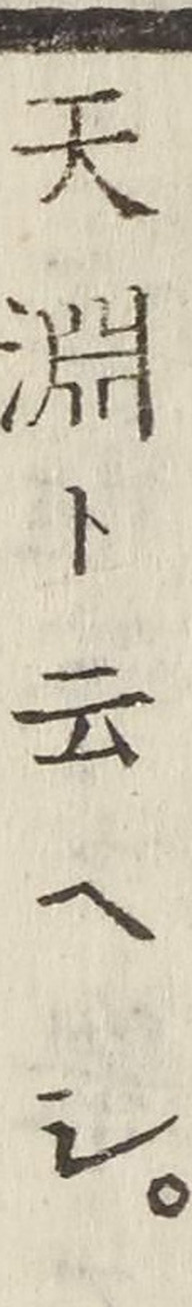天淵ト云ヘシ。
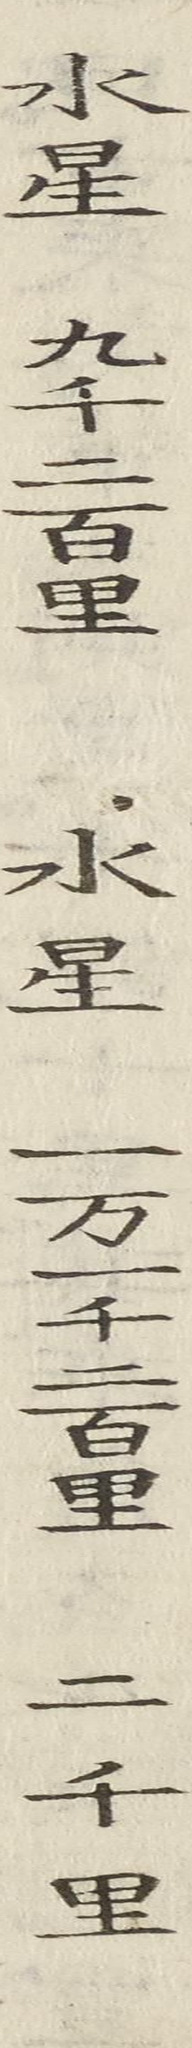水星九千二百里水星一万一千二百里二千里
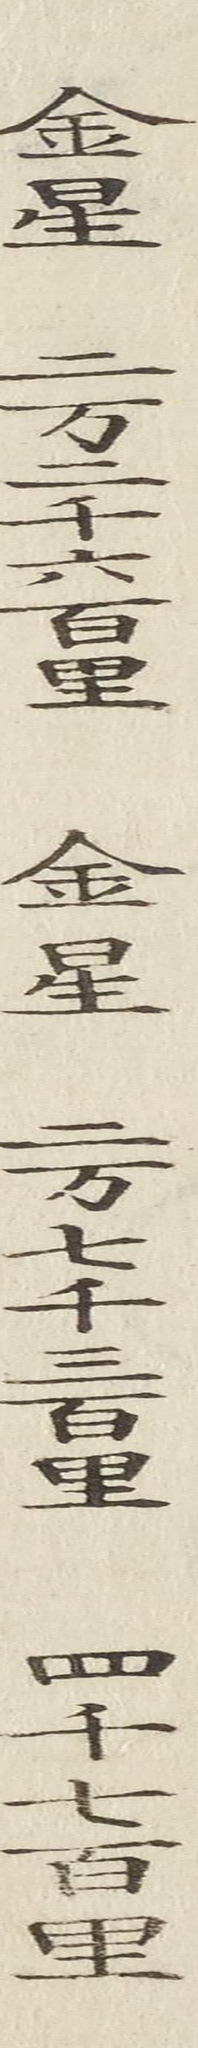金星二万二千六百里金星二万七千三百里四千七百里
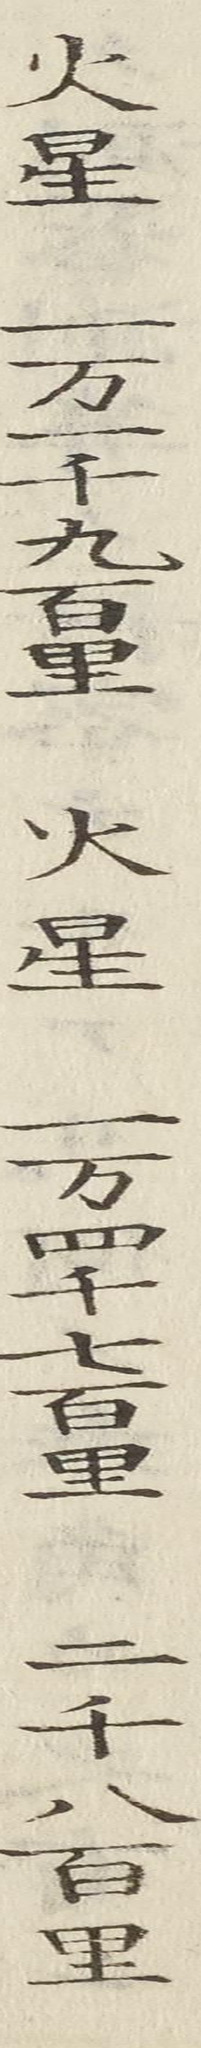火星一万一千九百里火星一万四千七百里二千八百里
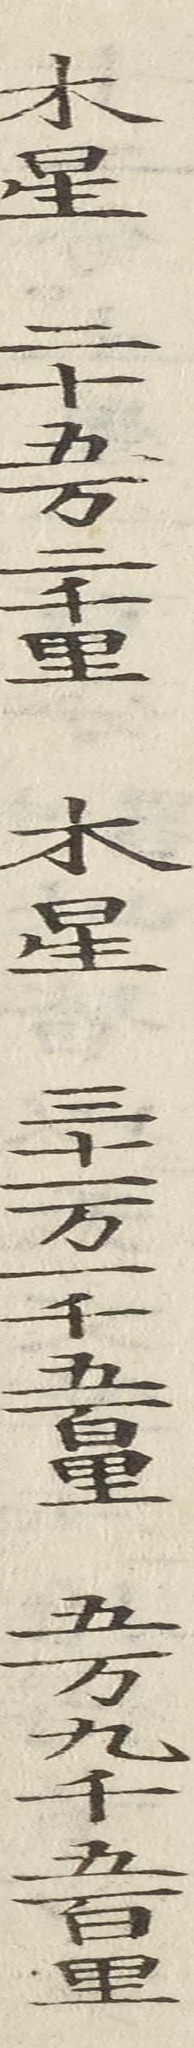木星二十五万二千里木星三十一万一千五百里五万九千五百里
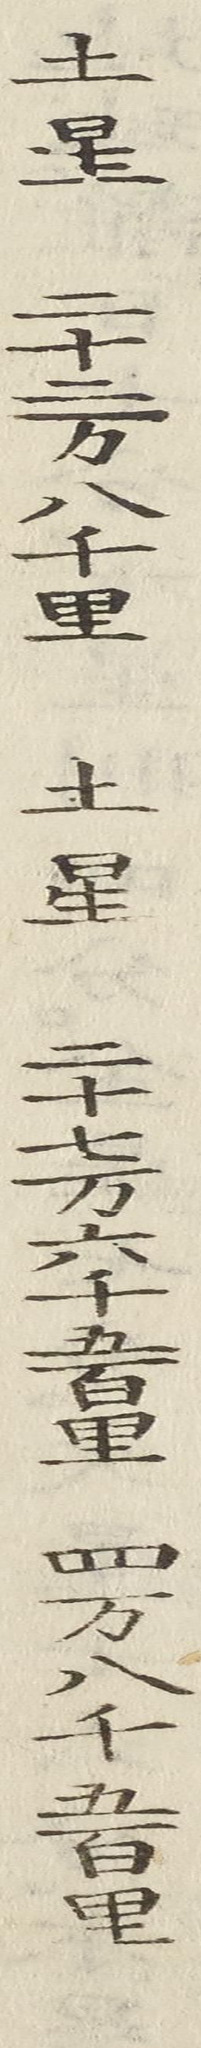土星二十二万八千里土星二十七万六千五百里四万八千五百里
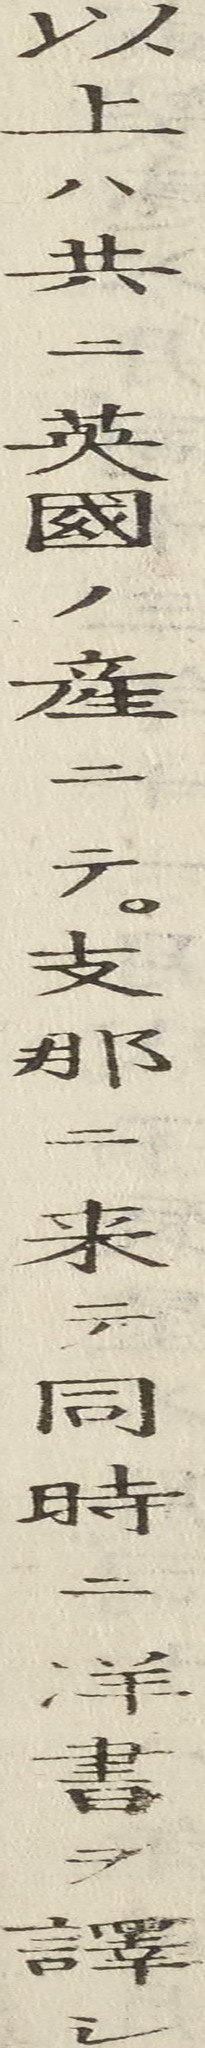以上ハ共ニ英国ノ産ニテ。支那ニ来テ同時ニ洋書ヲ訳シ
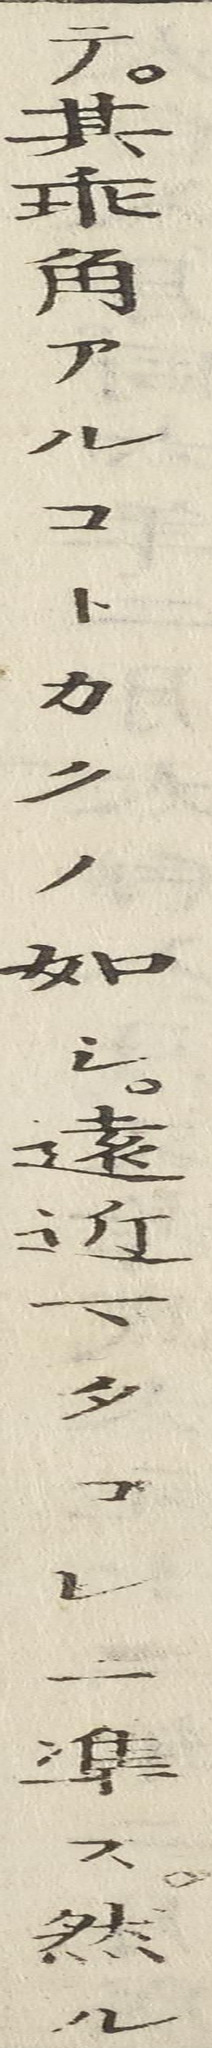テ。其乖角アルコトカクノ如シ。遠近マタコレニ準ス。然ル
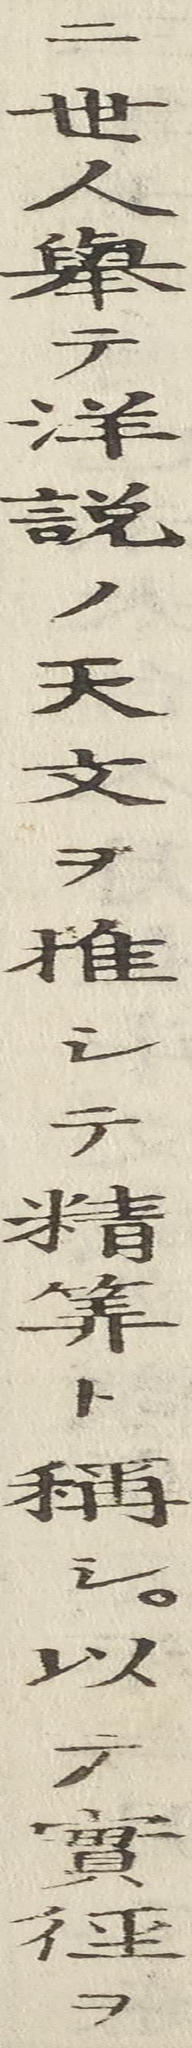ニ世人挙テ洋説ノ天文ヲ推シテ精算ト称シ。以テ実径ヲ
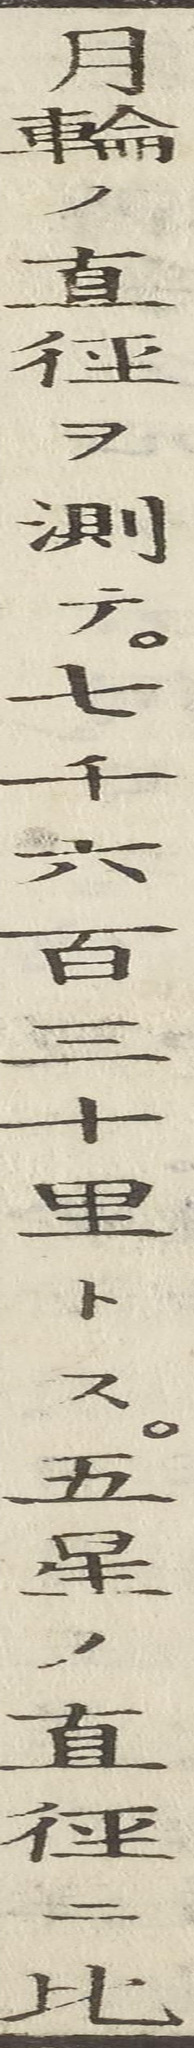月輪ノ直径ヲ測テ。七千六百三十里トス。五星ノ直径ニ比
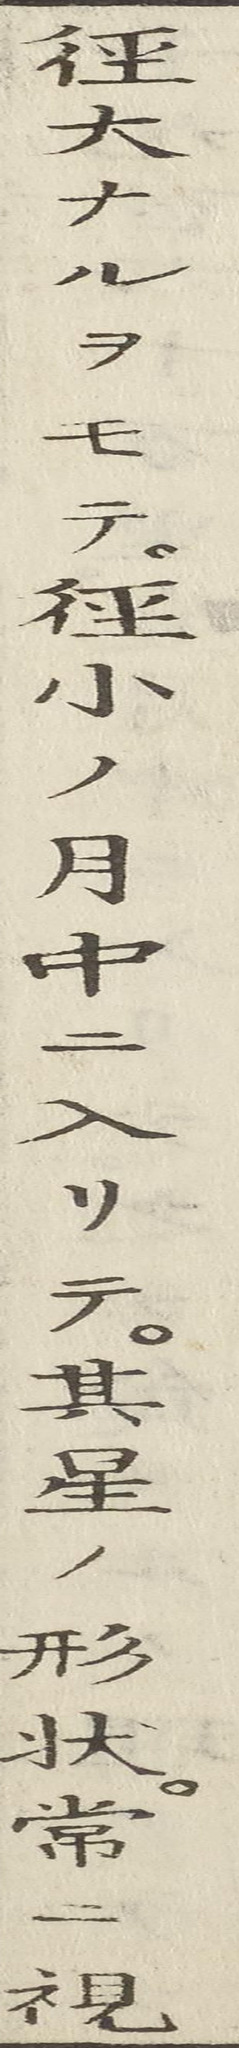径大ナルヲモテ。径小ノ月中ニ入リテ。其星ノ形状。常ニ視
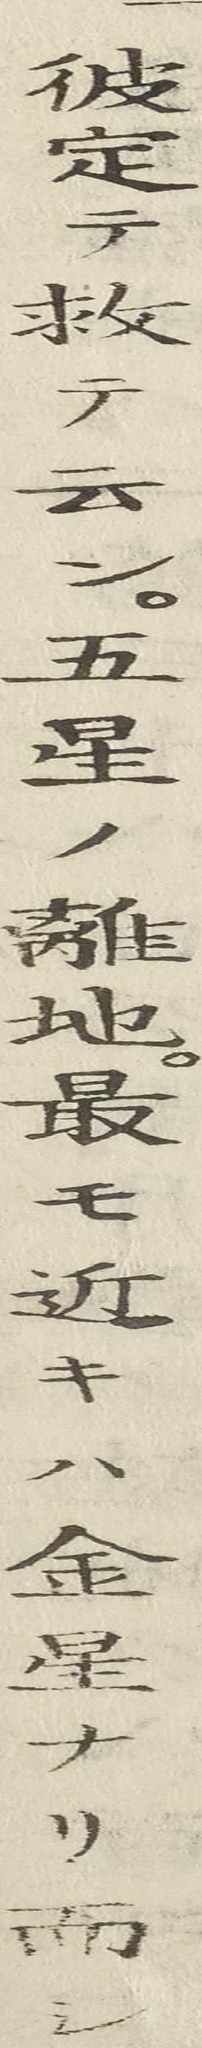ニ彼定テ救テ云ン。五星ノ離地。最モ近キハ金星ナリ而シ

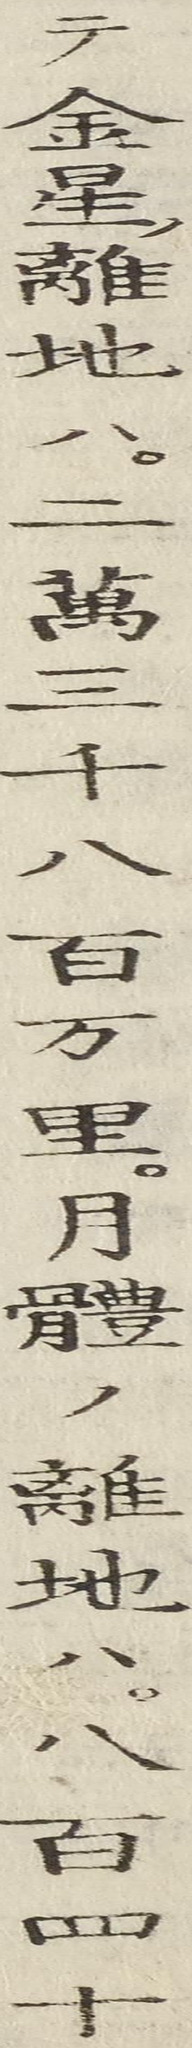テ金星離地ハ。二万三千八百万里。月体ノ離地ハ。八百四十
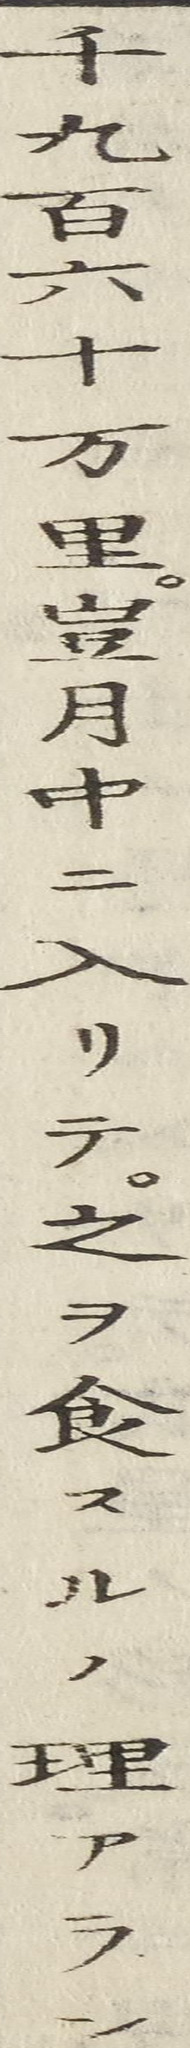千九百六十万里。豈月中ニ入リテ。之ヲ食スルノ理アラン
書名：護法新論　二編　下
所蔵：東京大学地震研究所図書室 Earthquake Research Institute Library, The University of Tokyo, JAPAN
